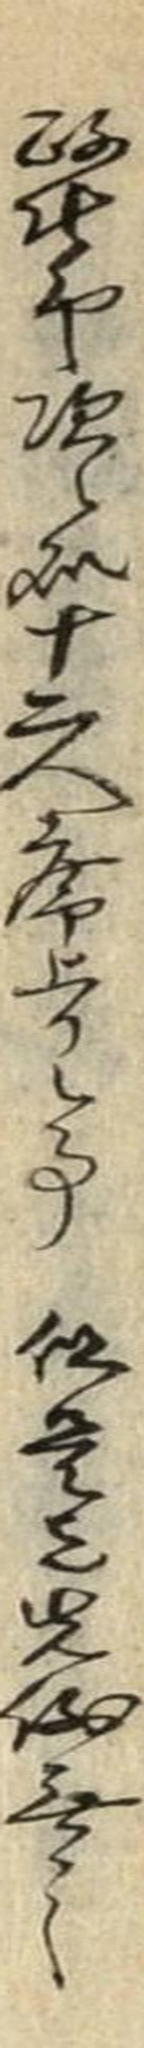政次郎次之処十二人席上り候事但是迄先例無之
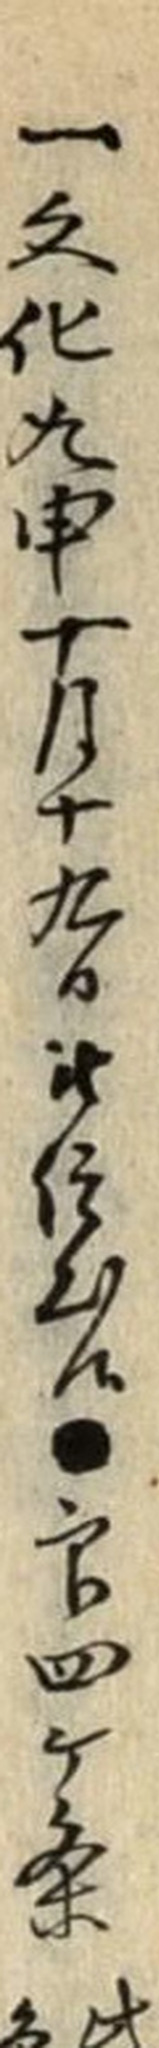一文化九申十月十九日被仰出候●印四ヶ条
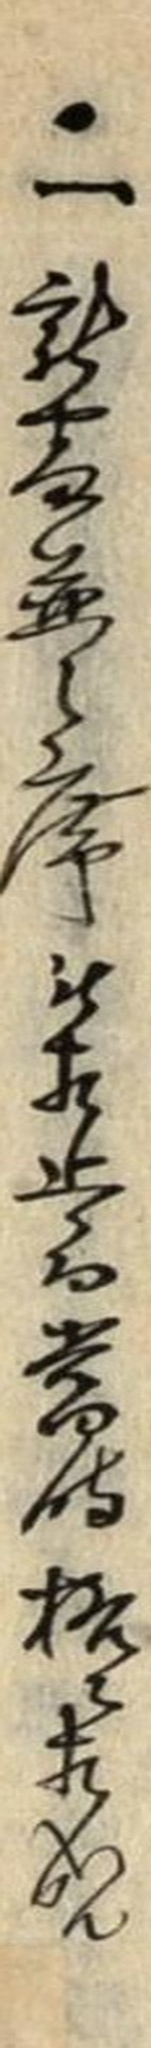●一新番並之席被相止候而常時格に相成候
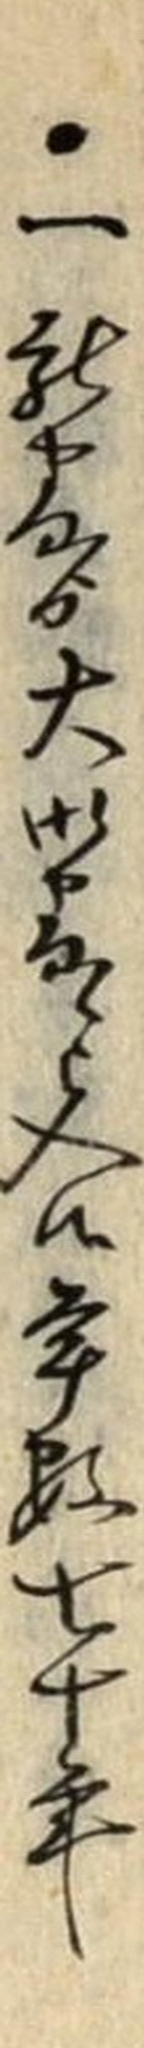●一新番ゟ大御番へ被入候年数七十年
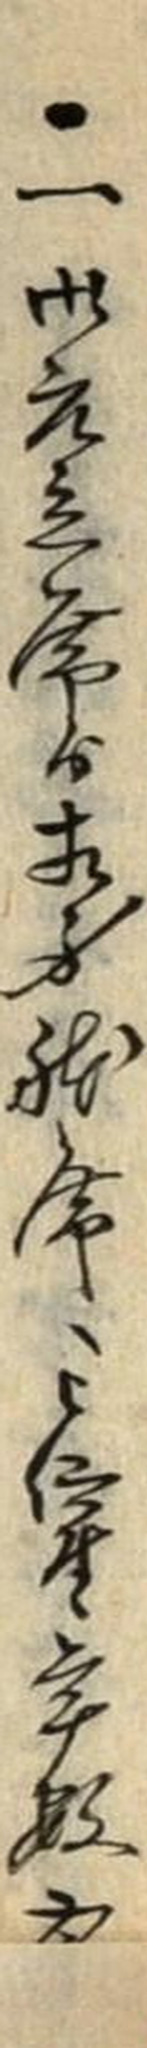●一御取立席ゟ相身体席へ被仰付年数五十年
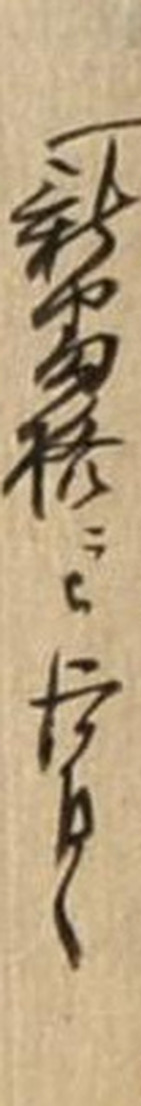新番格に被仰付候
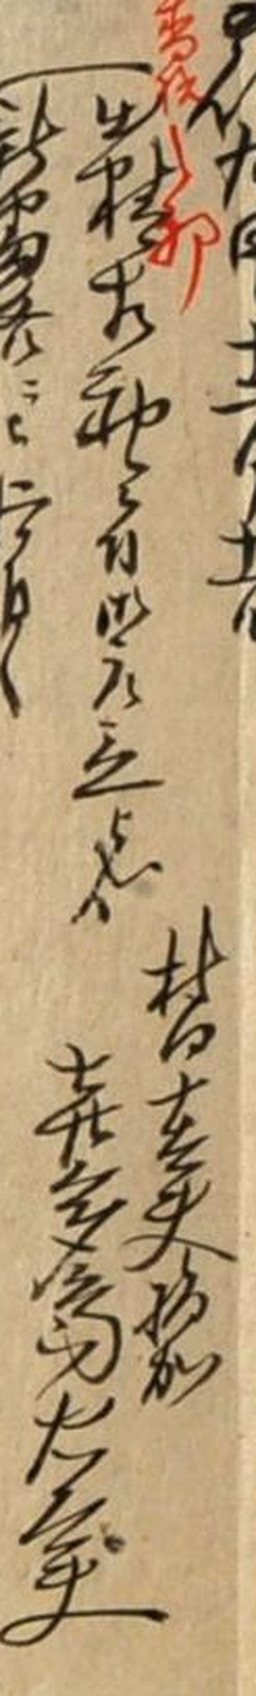出精相勤候に付御取立被成喜多嶋忠太夫
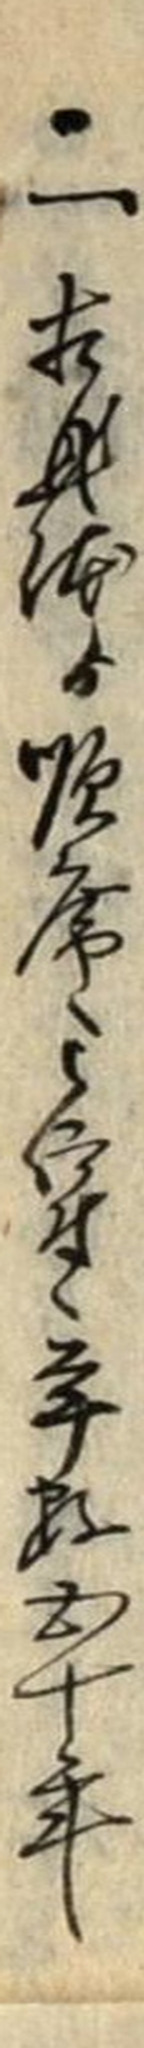●一相身体ゟ順席へ被仰付候年数五十年
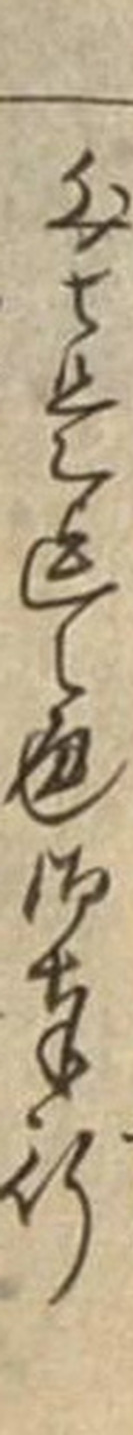分は是迄之通御奉行
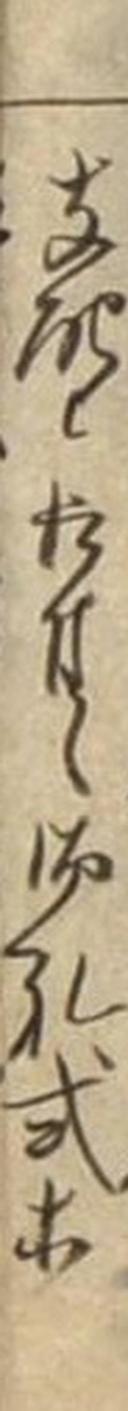支配被仰付之御礼式等
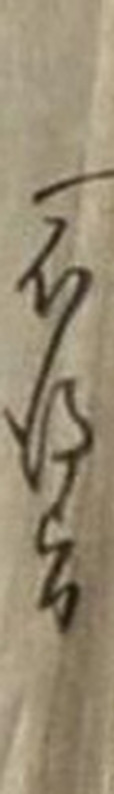心得旨
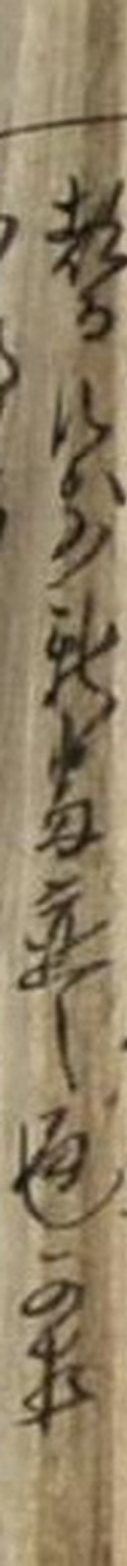都而以前新番並之通可相

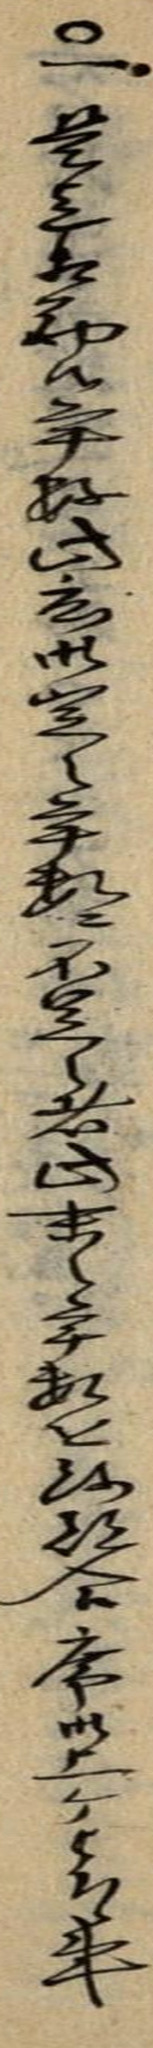○一是迄相勤候年数此度御定之年数に不足之者此未之年数と致都合席御上ケ被下候事
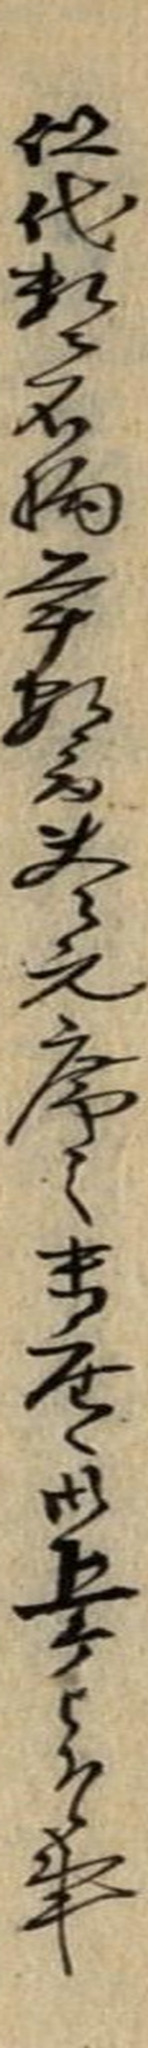但代数に不拘年数に而夫々元席之未座へ御上ケ被下候事
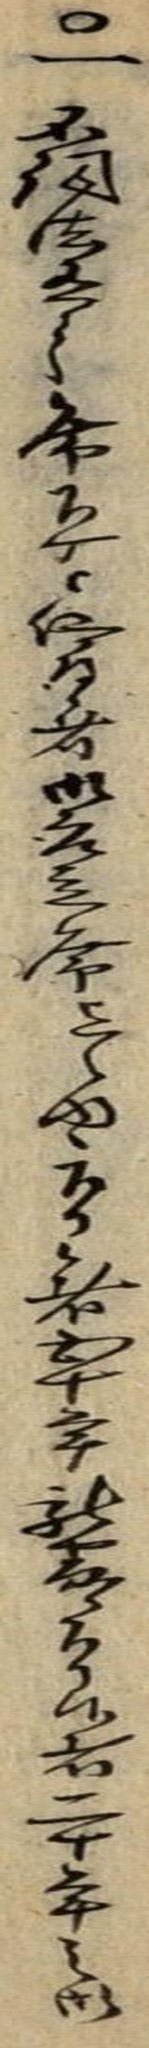○一不調法有之席下ヶ被仰付候者御取立席迄之内へ下り候者五十年新番へ下り候者二ヶ年之御
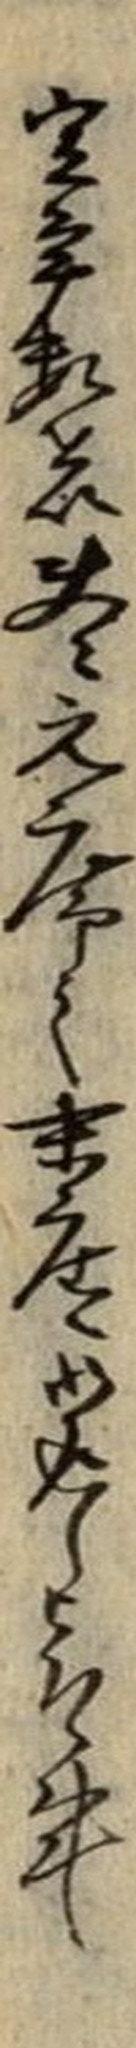定年数を以夫々元席之未座へ返し被下候事
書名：御用并被仰出之部
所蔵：福井県文書館 Fukui Prefectural Archives
